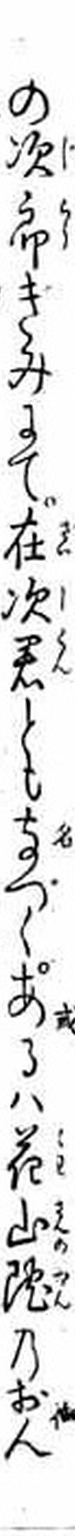の次郎ぎみにて。在次君ともなづく。あるは花山院のおん
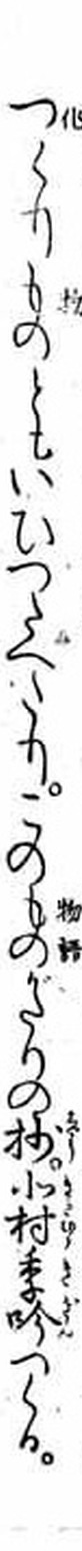つくりものともいひつたへたり。このものがたりの抄。北村季吟つくる。
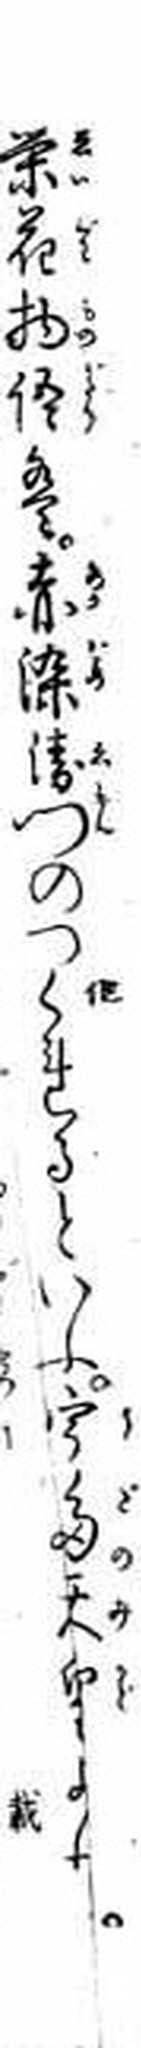栄花物語は。赤染衛門のつくれるといふ。宇多天皇より。
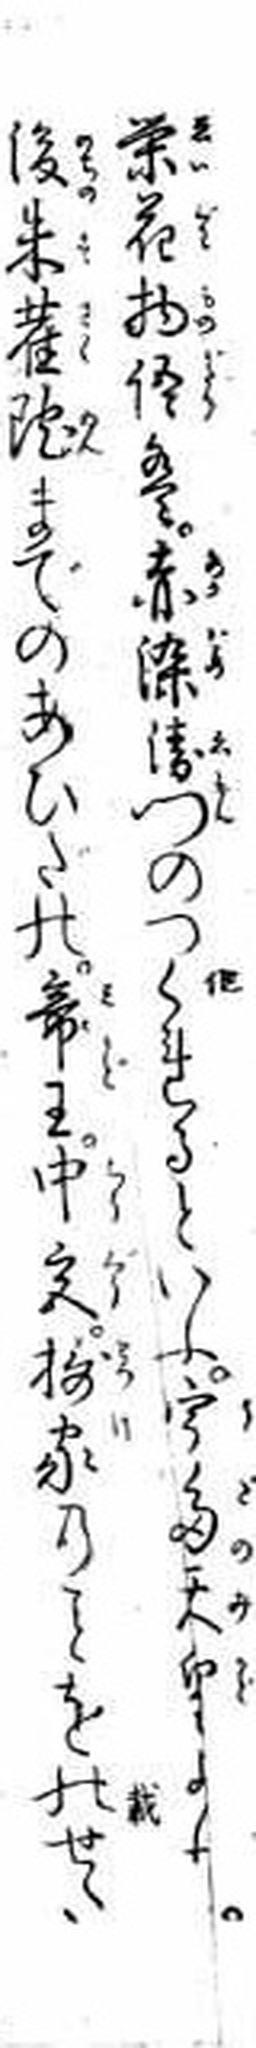後朱雀院までのあひだの。帝王。中宮。摂家のことをのせた
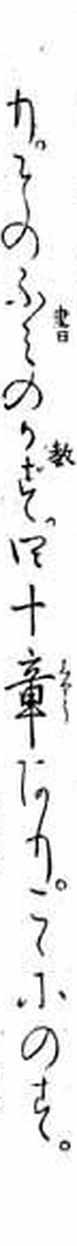り。そのふみのかず。四十章あり。こゝにのす。
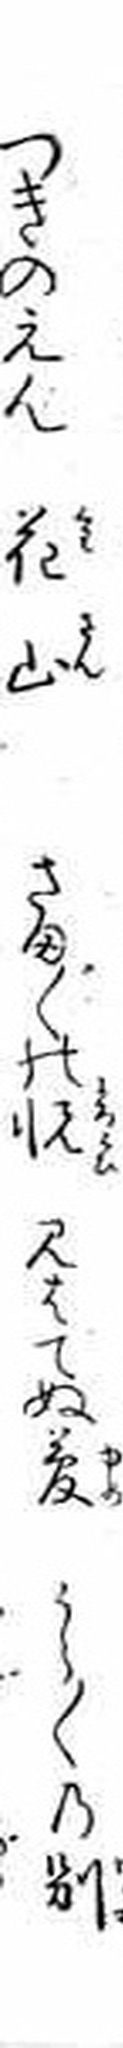つきのえん花山さま〴〵の悦見はてぬ夢うら〳〵の別
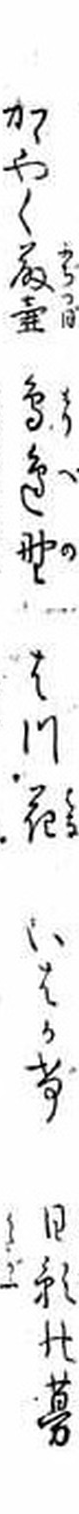かゝやく藤壺鳥辺野はつ花いはかげ日影の葛
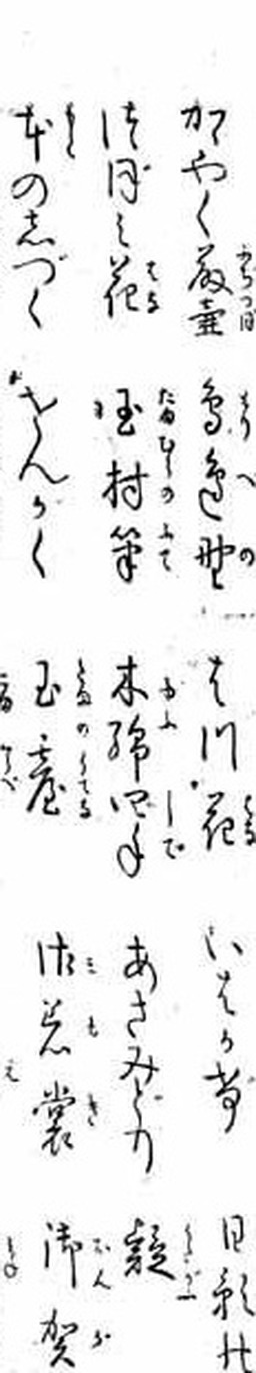つぼみ花玉村筆木綿四手あさみどり疑
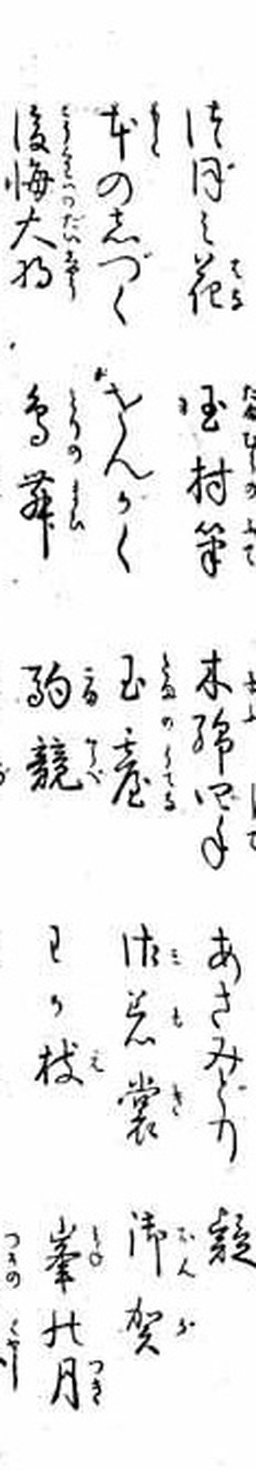本のしづくをんがく玉台御着裳御賀
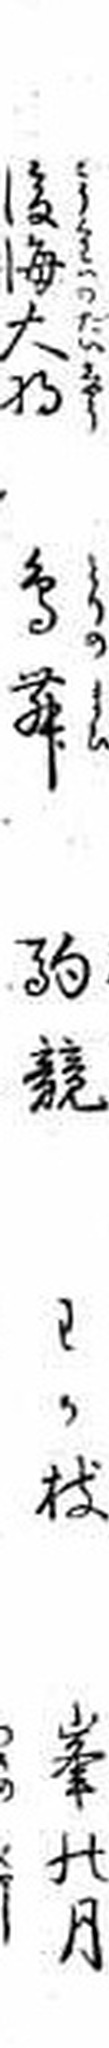後悔大将鳥舞駒競わか枝峯の月
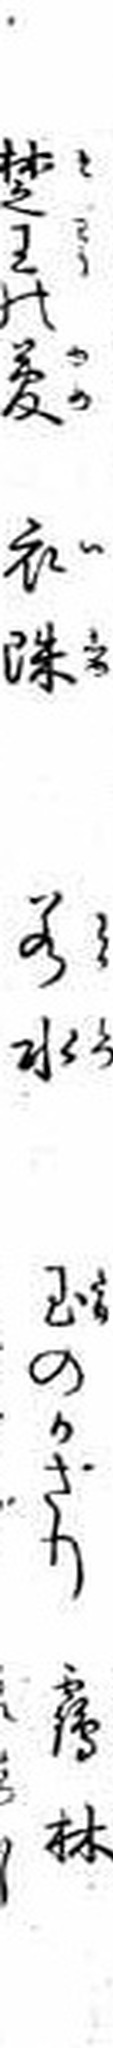楚王の夢衣珠若水玉のかざり鶴林

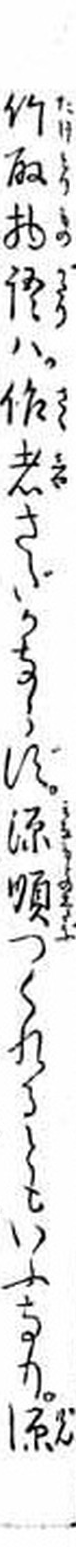竹取物語は。作者さだかならず。源順つくれるともいふなり。源
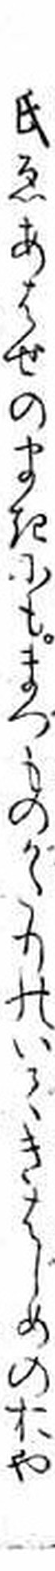氏ゑあはせのまきにも。まづものがたりのいできはじめのおや
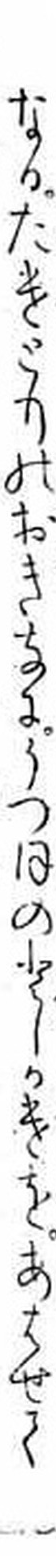なる。たけとりのおきなに。うつほのとしかけを。あはせて
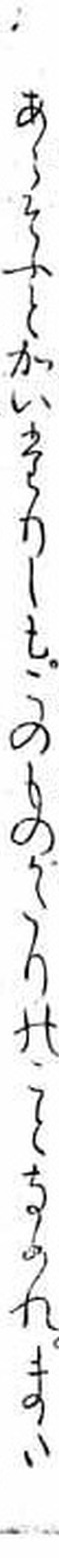あらそふとかいたりしも。このものがたりのことなかれ。また
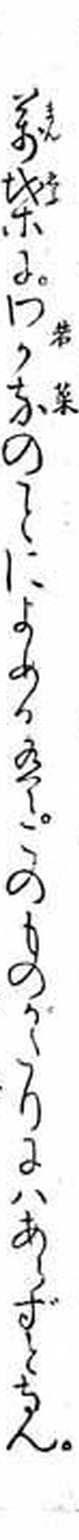万葉に。わかなのことによめるは。このものがたりにはあらずとなん。
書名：女学範
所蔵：東京学芸大学教育コンテンツアーカイブ
